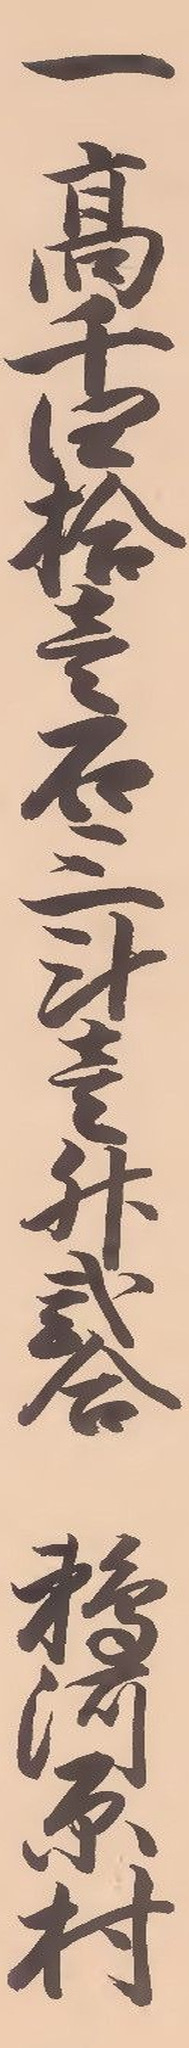一高千四拾壱石三斗壱升弐合鵜河原村
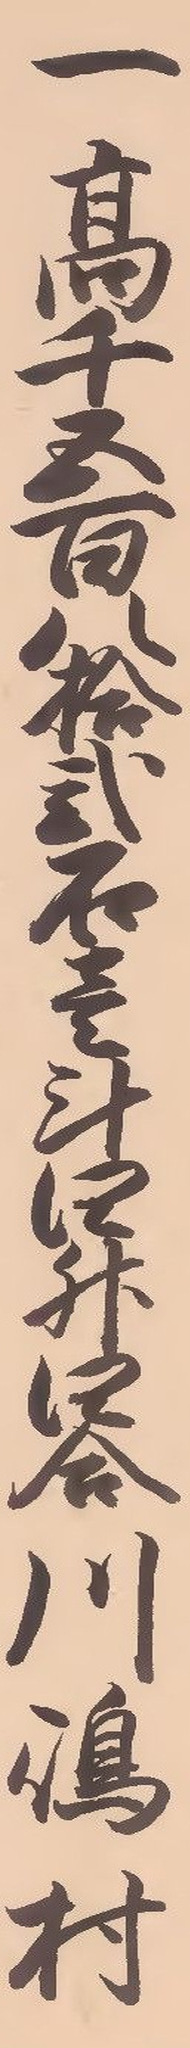一高千五百八拾弐石壱斗四升四合川嶋村
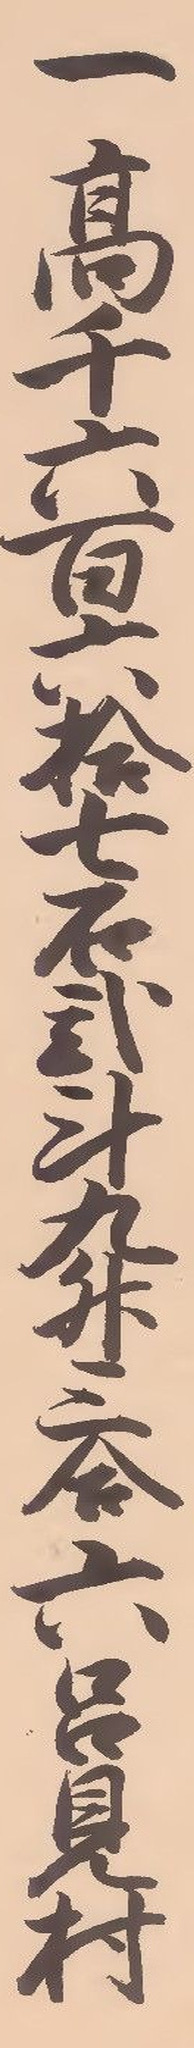一高千六百六拾七石弐斗九升三合六呂見村

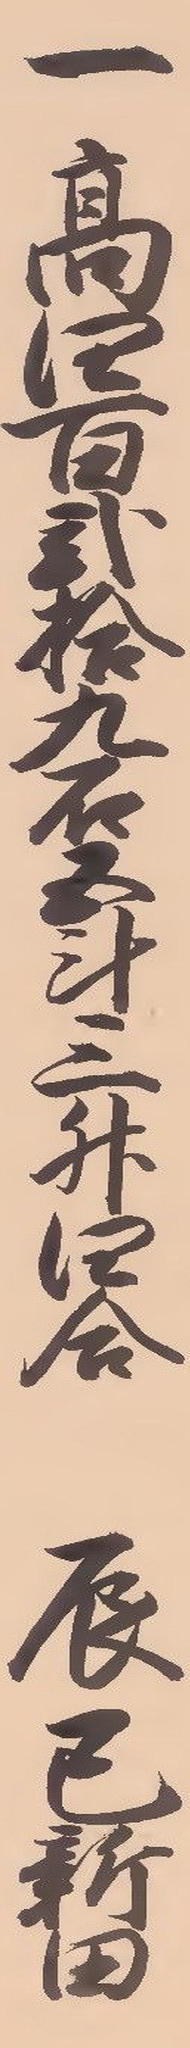一高四百弐拾九石五斗三升四合辰巳新田
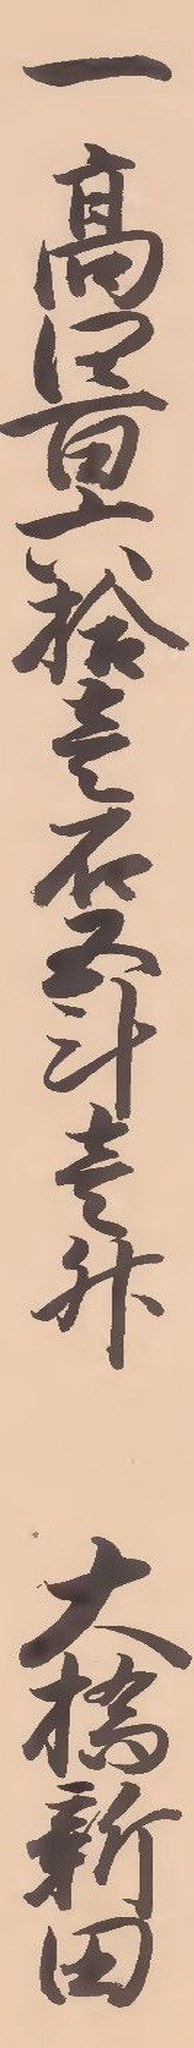一高四百六拾壱石五斗壱升大橋新田
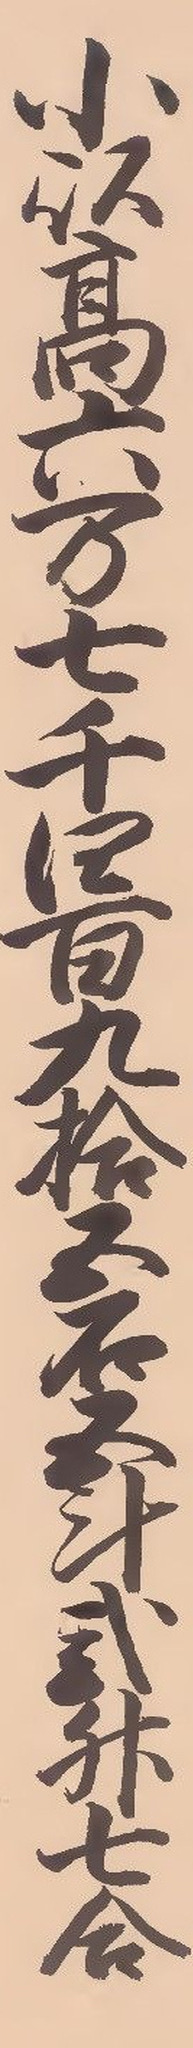小以高六万七千四百九拾五石五斗弐升七合
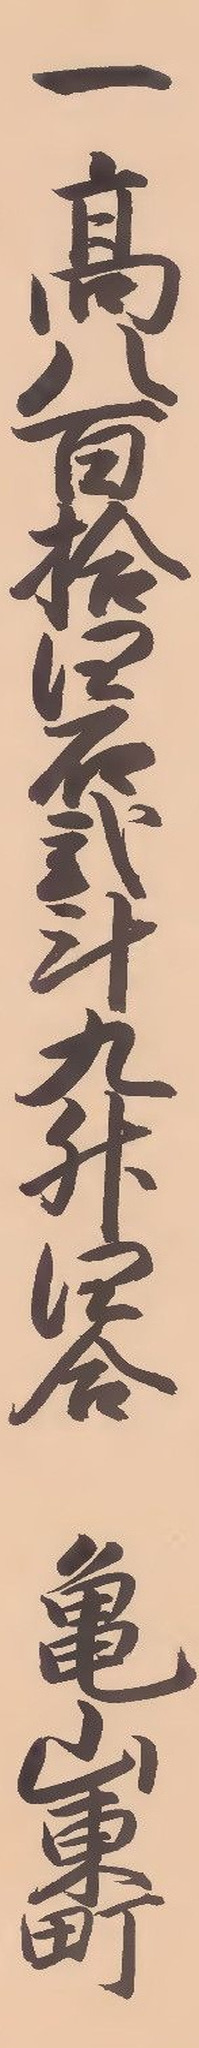一高八百拾四石弐斗九升四合亀山東町
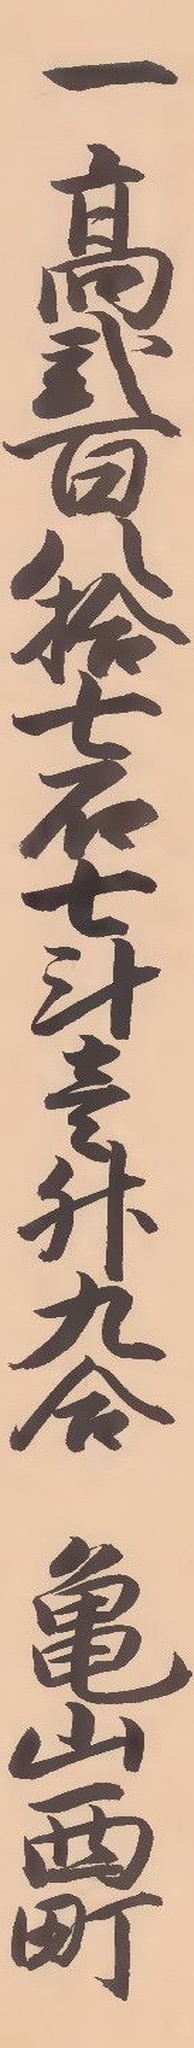一高弐百八拾七石七斗壱升九合亀山西町
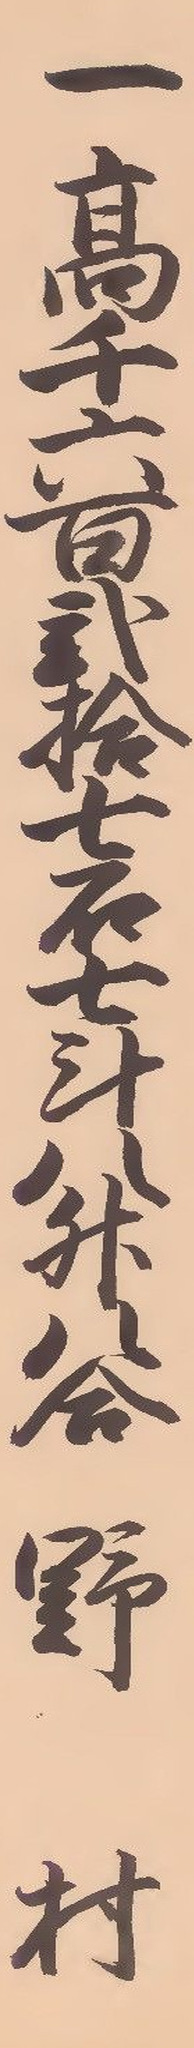一高千六百弐拾七石七斗八升八合野村

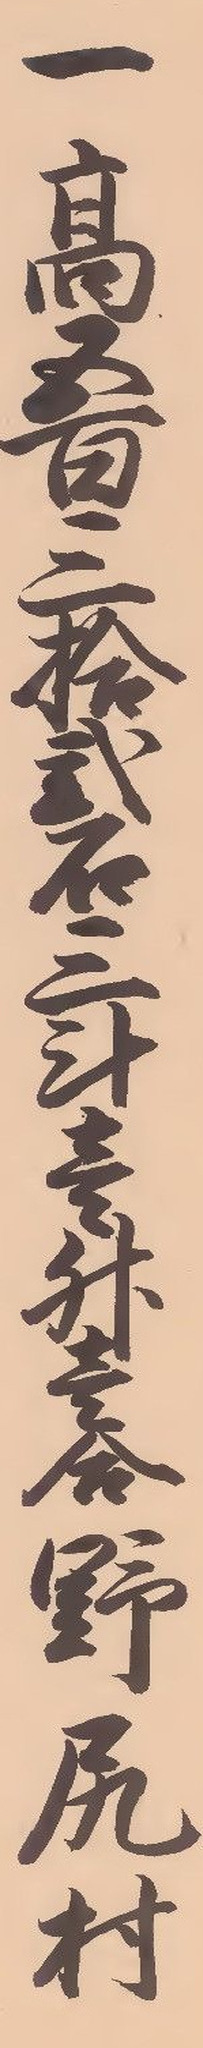一高五百三拾弐石三斗壱升壱合野尻村
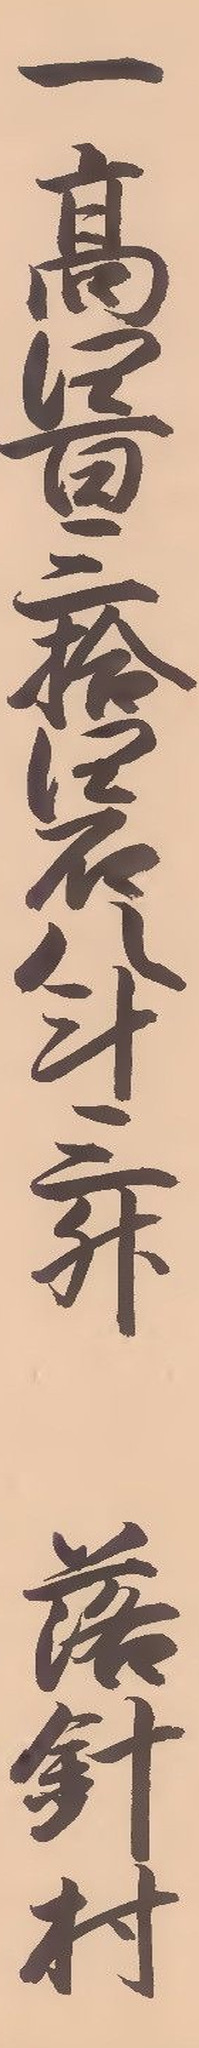一高四百三拾四石八斗三升落針村
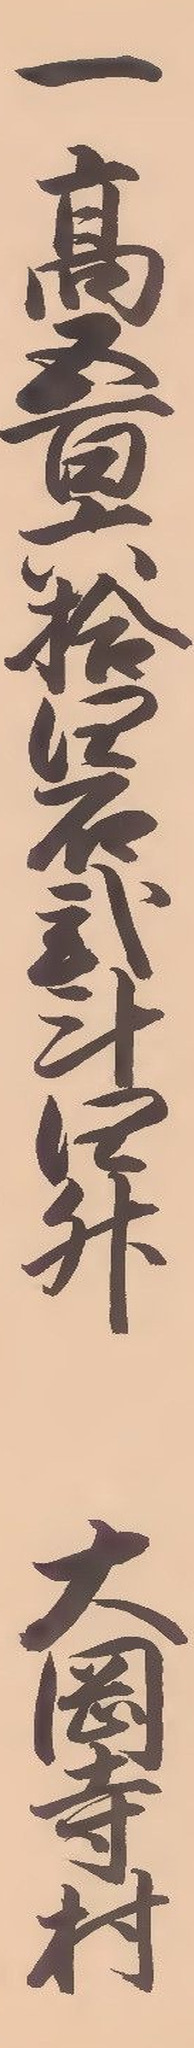一高五百六拾四石弐斗四升大岡寺村
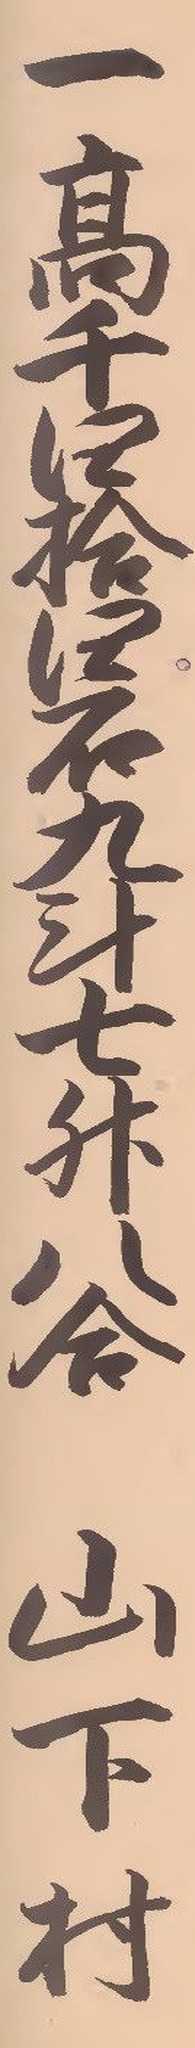一高千四拾四石九斗七升八合山下村
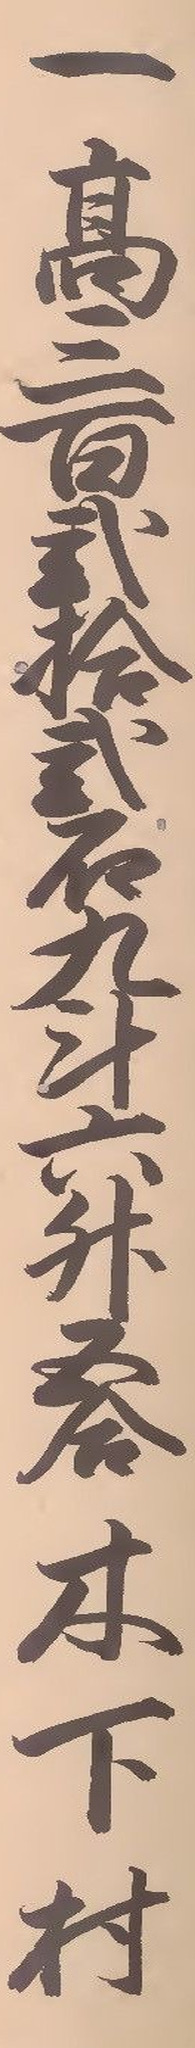一高三百弐拾弐石九斗六升五合木下村
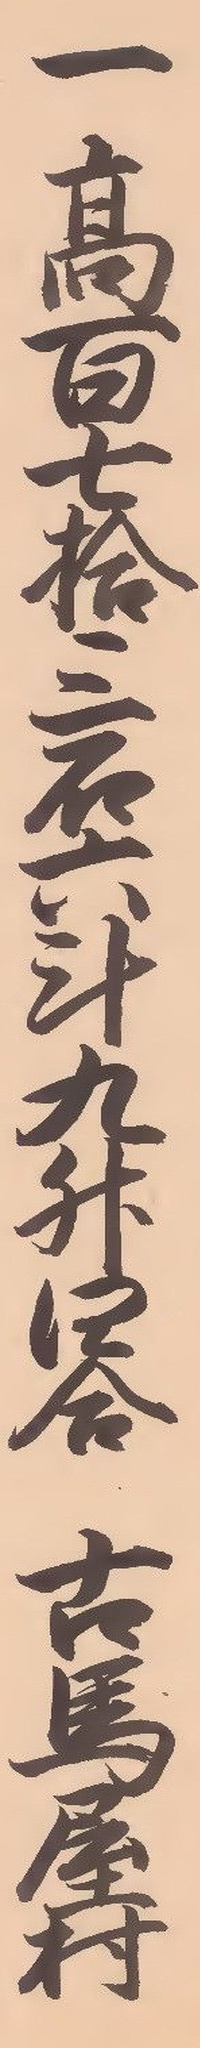一高百七拾三石六斗九升四合古馬屋村
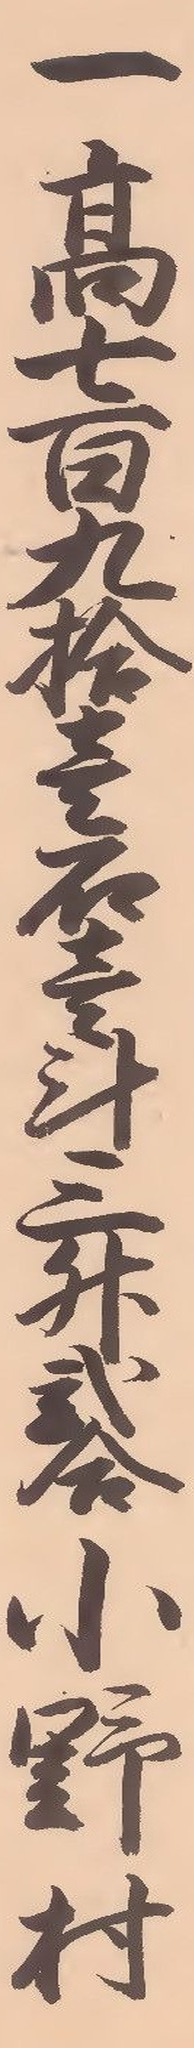一高七百九拾壱石壱斗三升二合小野村
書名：伊勢国郷帳
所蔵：国立公文書館 National Archives of Japan
